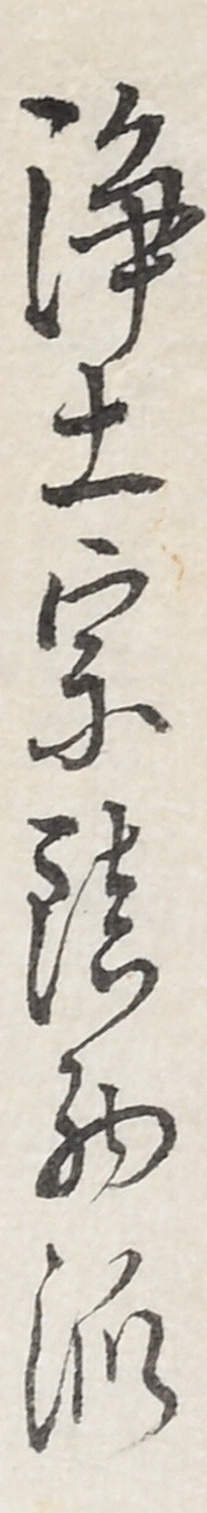浄土宗鎮西派

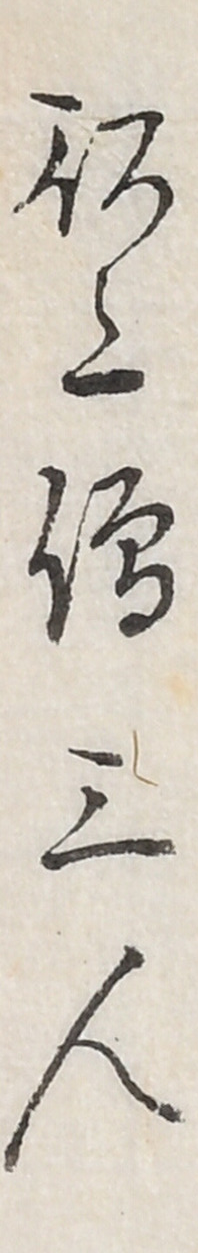以上僧三人
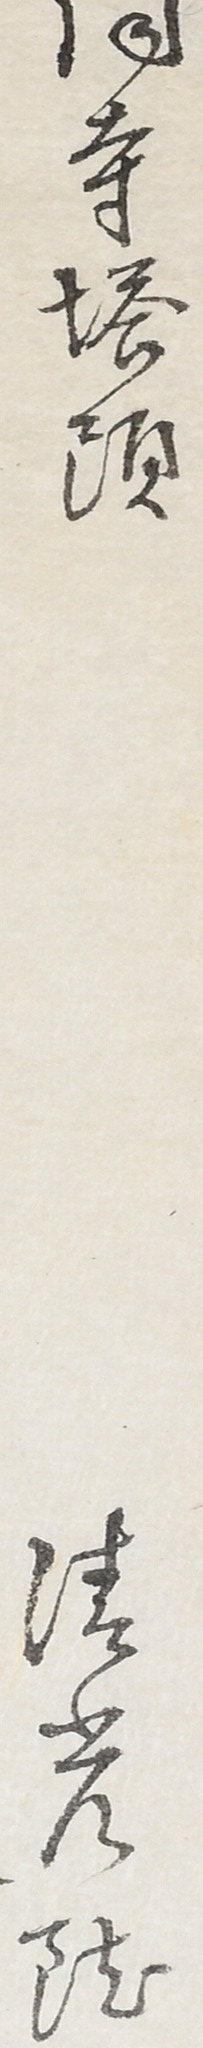同寺塔頭清光院
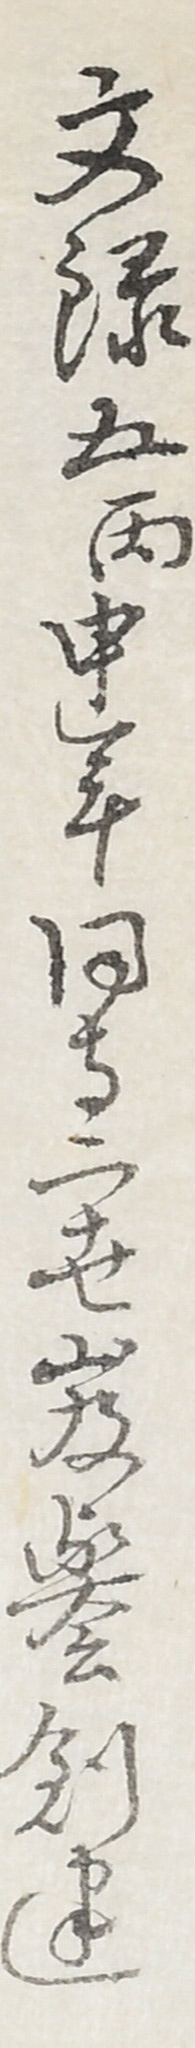文禄五丙申年同寺二世岌誉創建
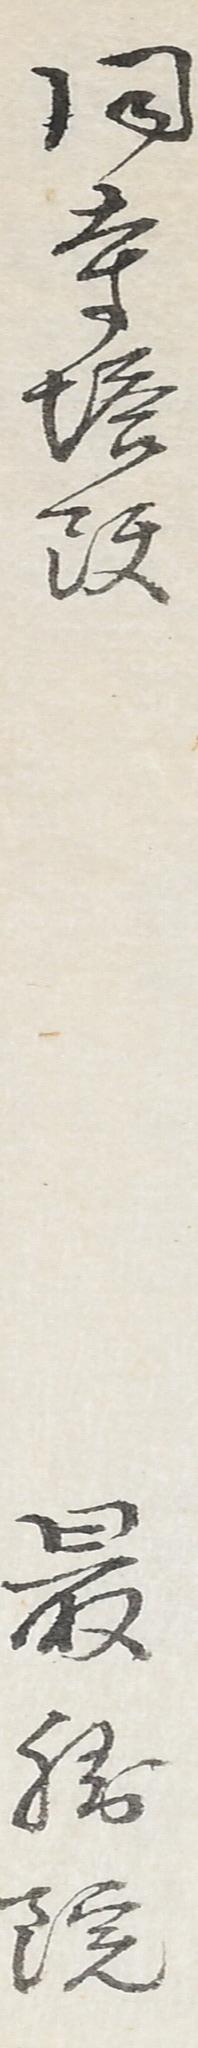同寺塔頭最勝院
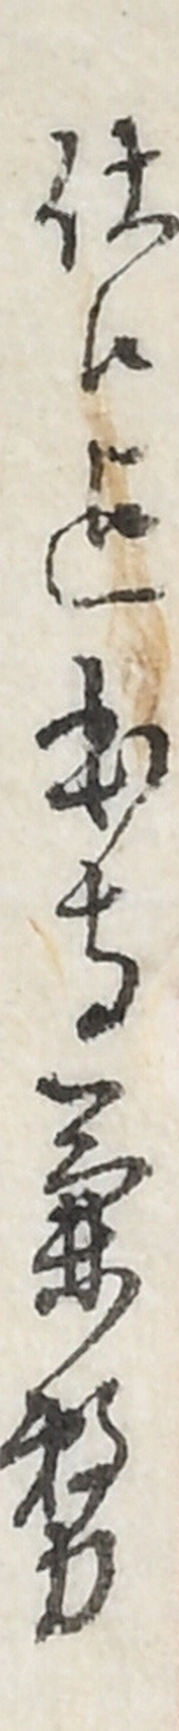仕候迄本寺兼務
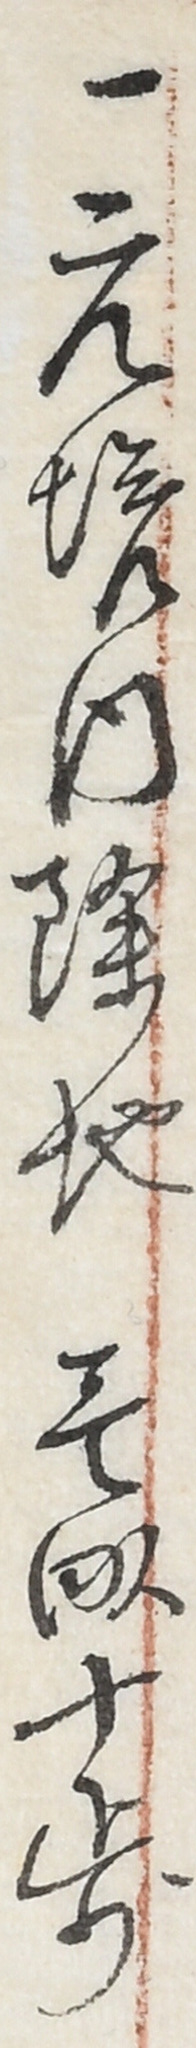一元境内除地壱畝十歩

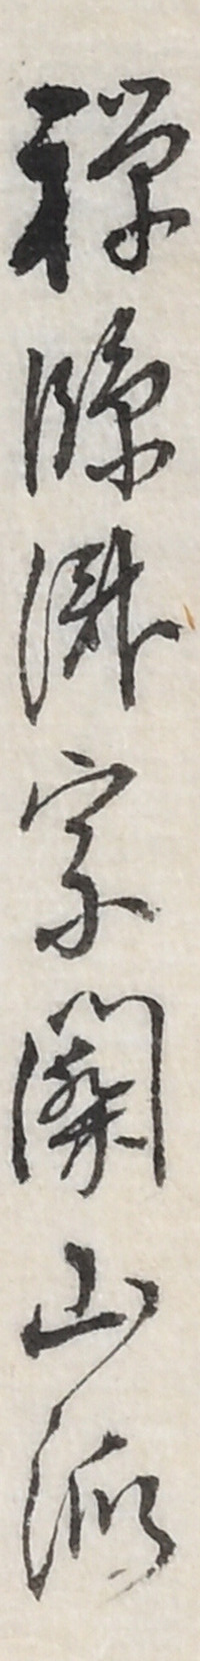禅臨済宗関山派
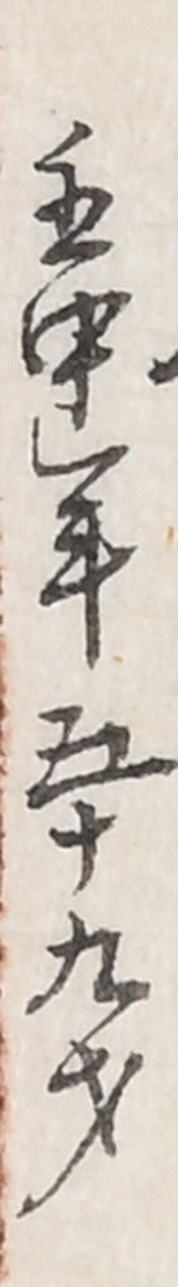壬申年五十九才

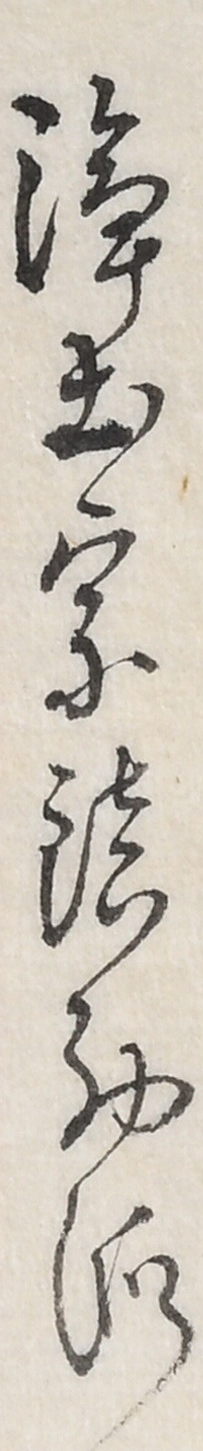浄土宗鎮西派
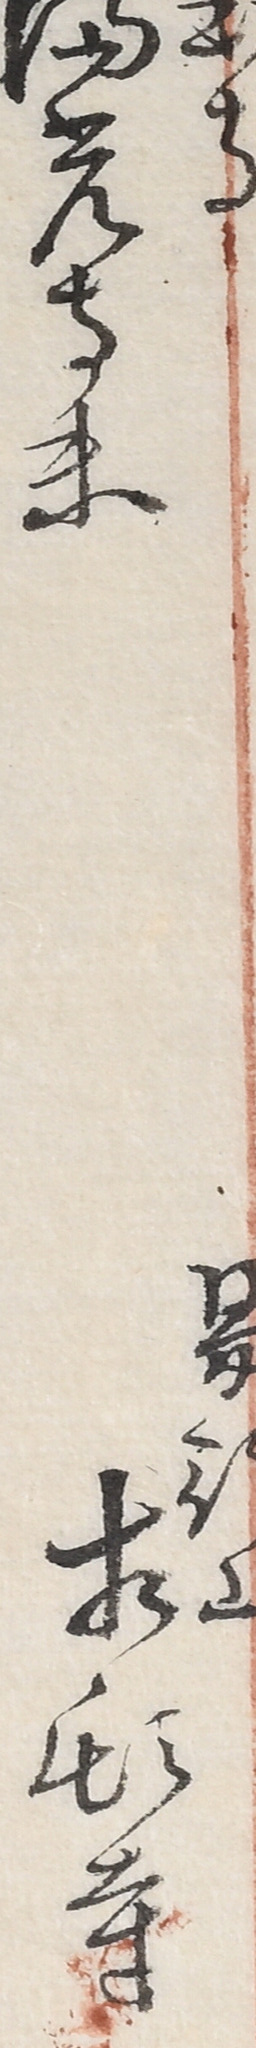満光寺末相頓寺
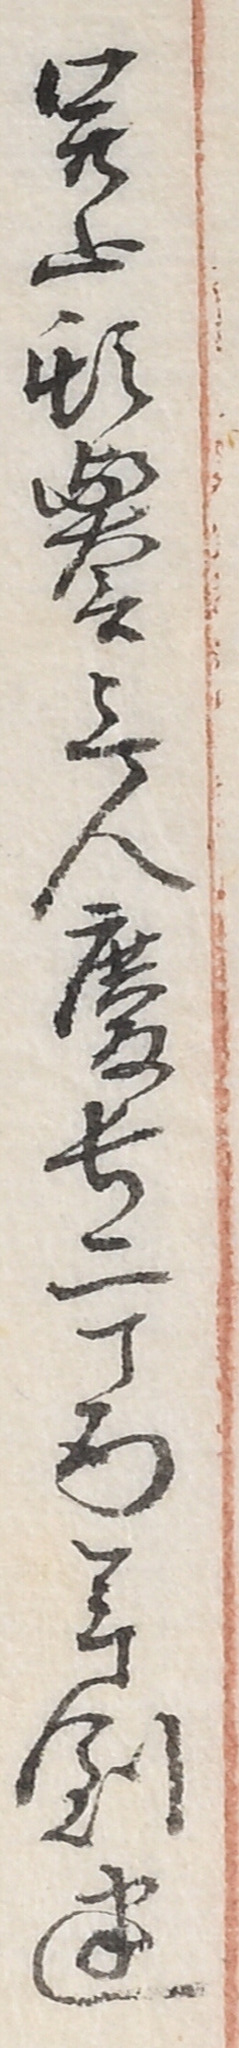開山頓誉上人慶長二丁酉年創建
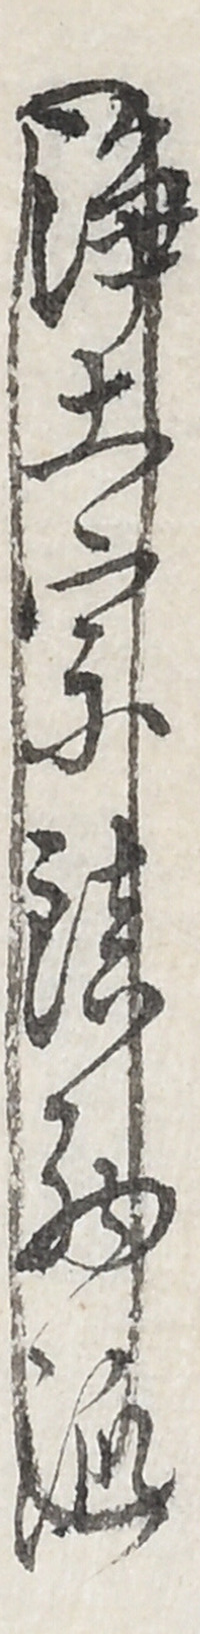浄土宗鎮西派
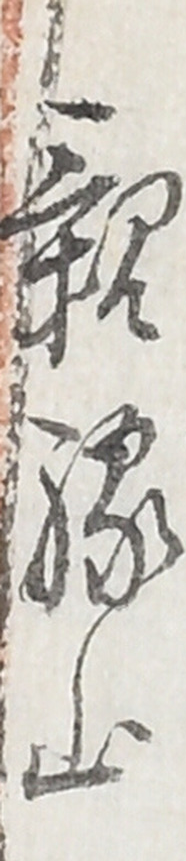親縁山
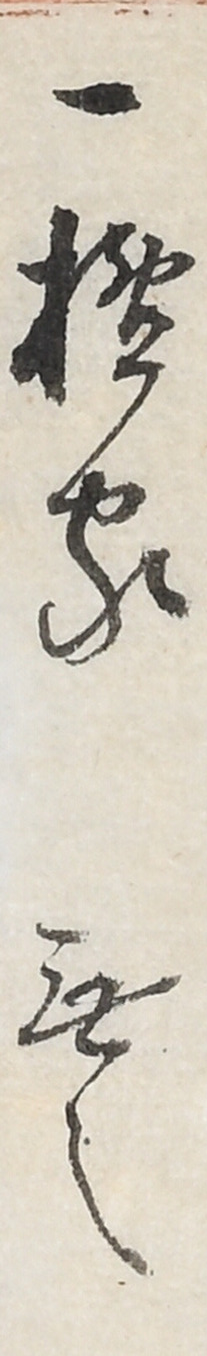一檀家無之
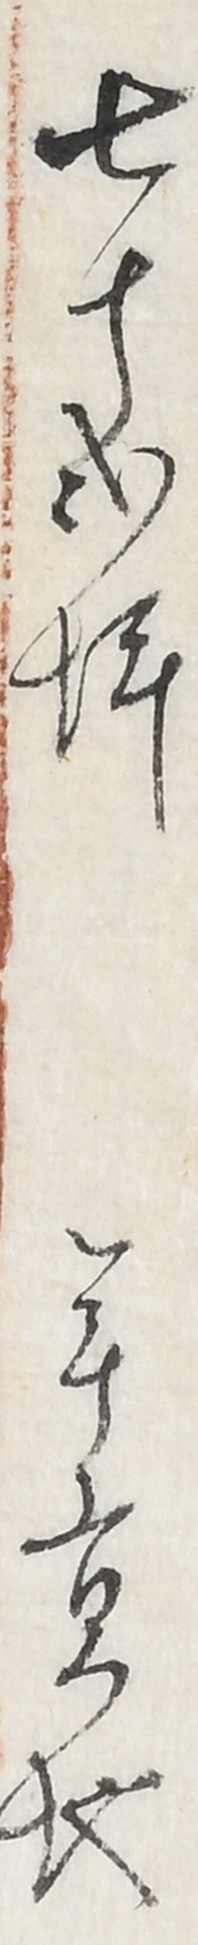七十弐坪年貢地
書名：壹番・御布告一式
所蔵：伊那市立高遠町図書館・合同会社AMANE
